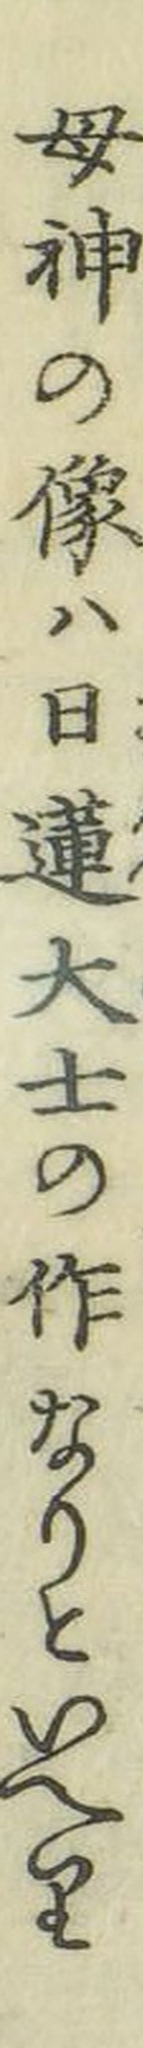母神の像は日蓮大士の作なりといへり

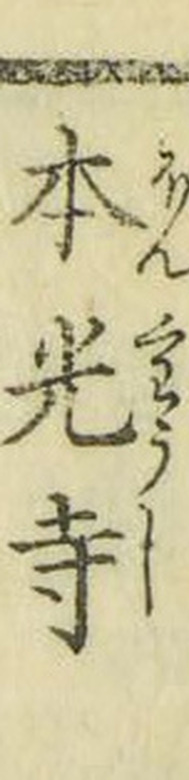本光寺
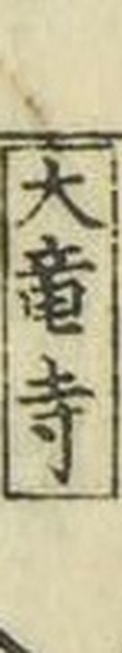大竜寺
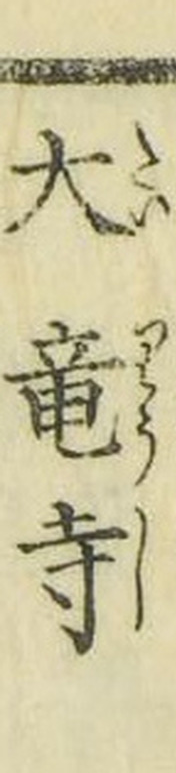大竜寺
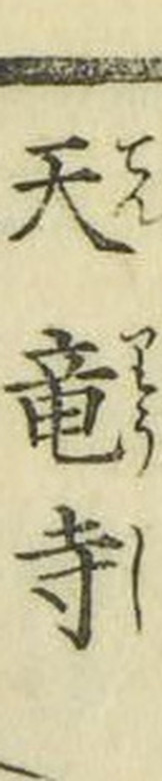天竜寺
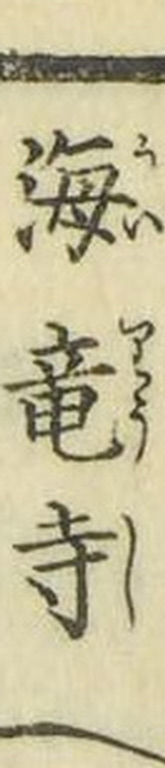海竜寺
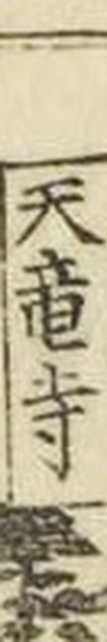天竜寺
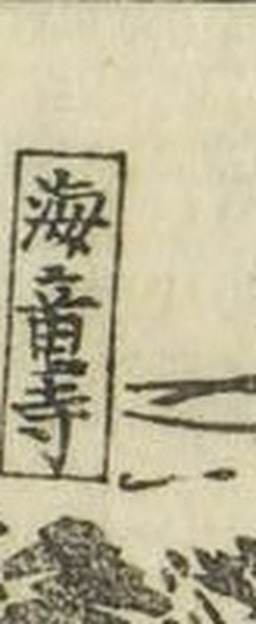海竜寺

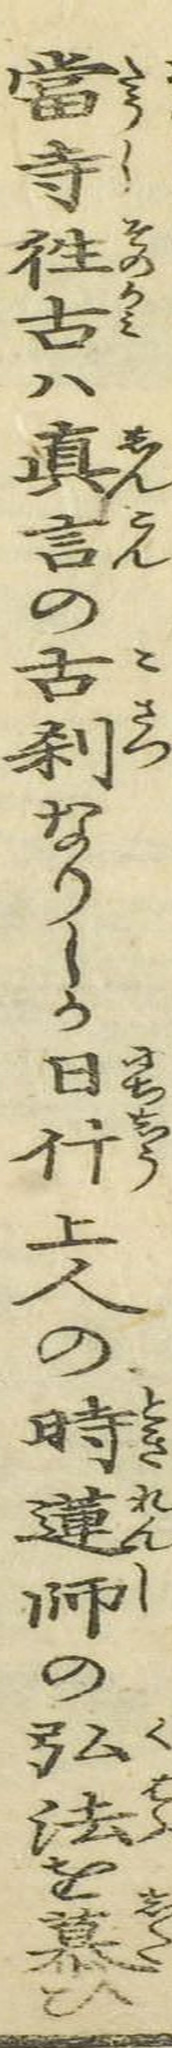當寺往古は眞言の古刹なりしか日什上人の時蓮師の弘法を慕ひ
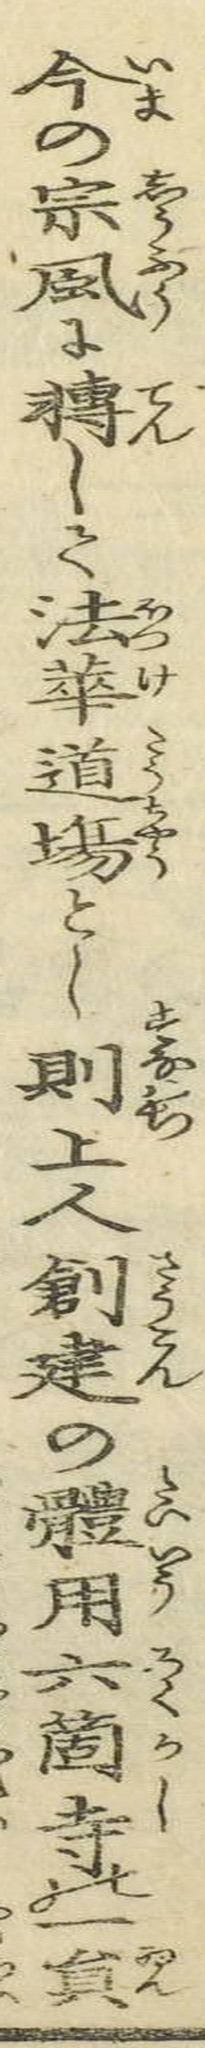今の宗風に轉して法華道塲とし則上人創建の體用六箇寺の一員
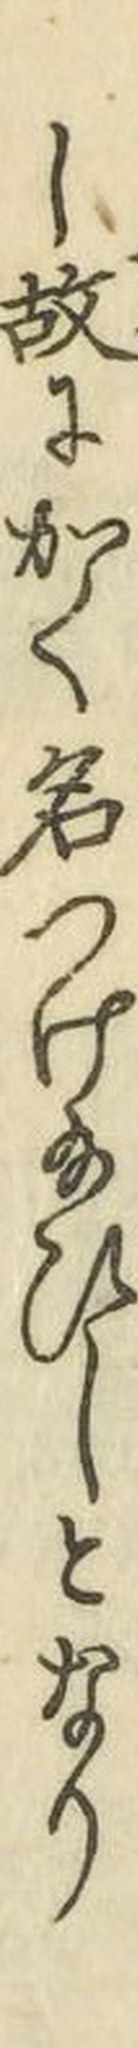し故にかく名つけ給ひしとなり
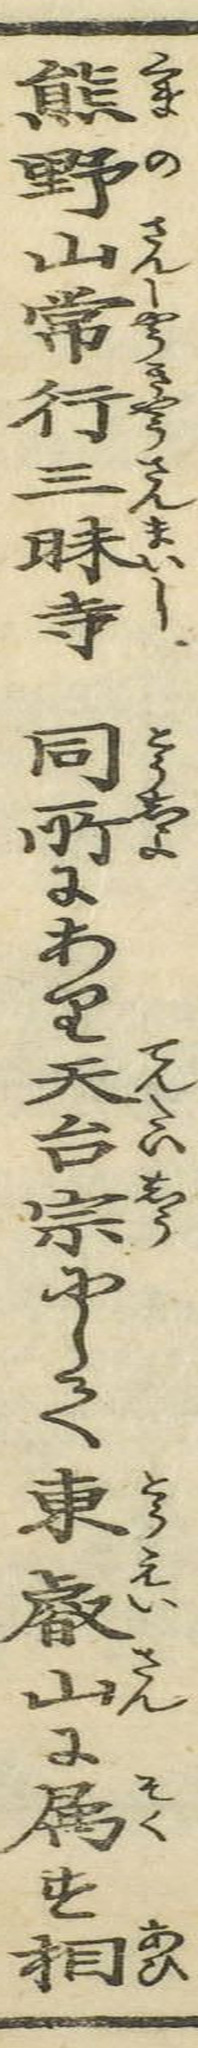熊野山常行三昧寺同所にあり天台宗にして東叡山に属す相
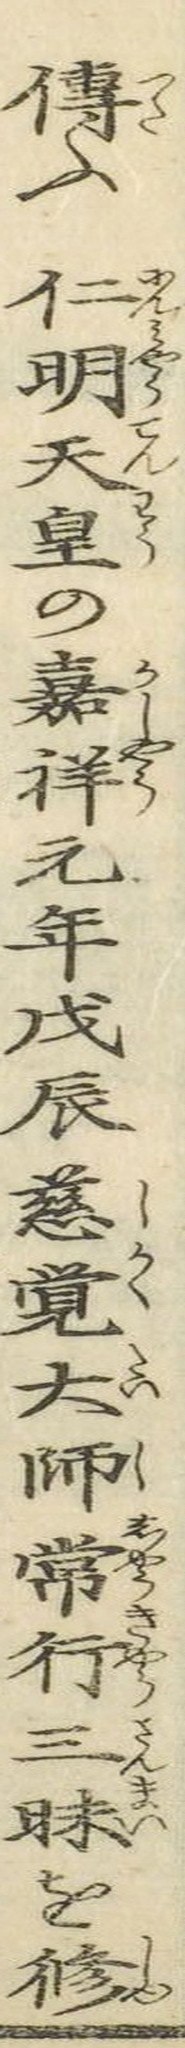傳ふ仁明天皇の嘉祥元年戊辰慈覚大師常行三昧を修
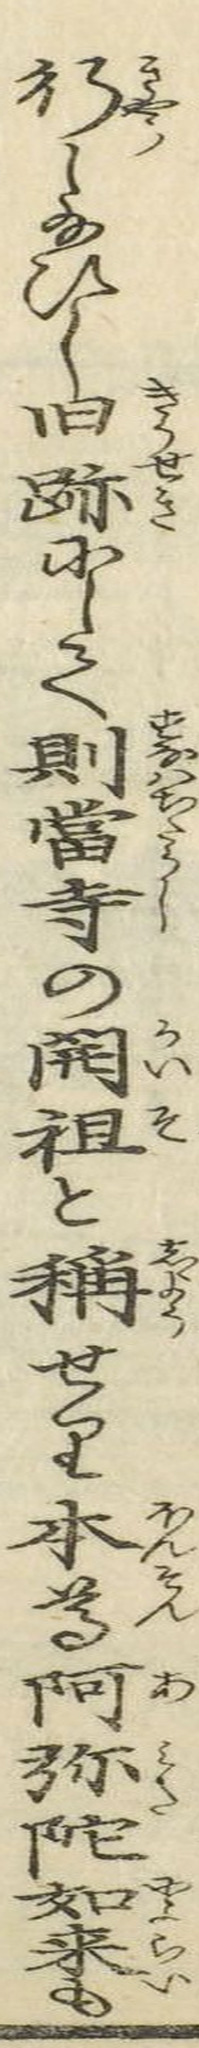行し給ひし旧跡にして則當寺の開祖と稱せり本尊阿弥陀如来も
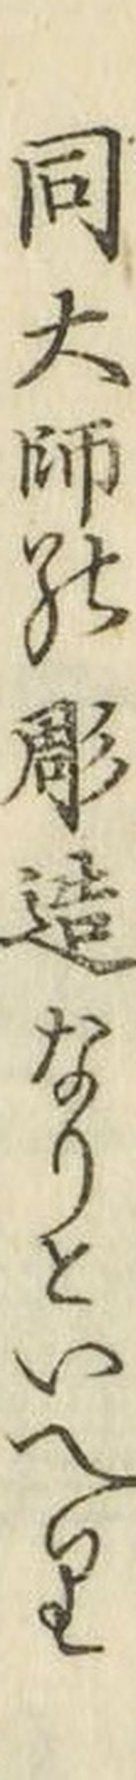同大師の彫造なりといへり
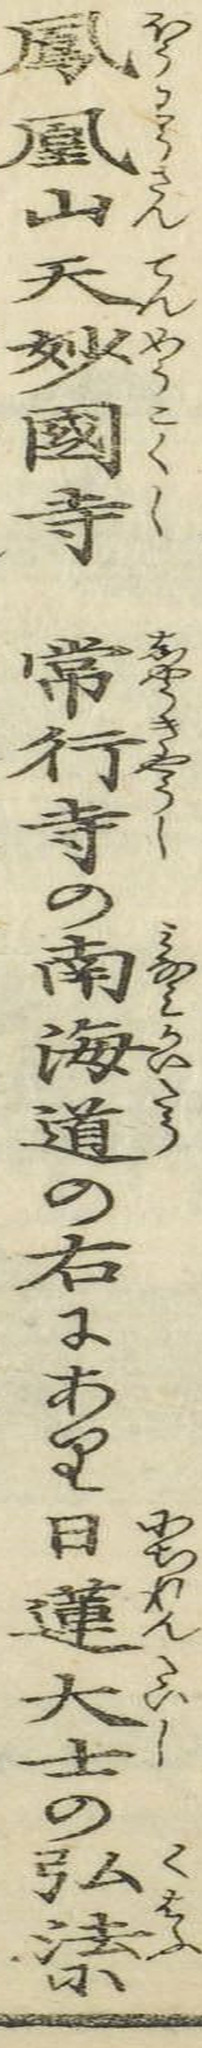鳳凰山天妙國寺常行寺の南海道の右にあり日蓮大士の弘法に
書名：江戸名所図会 20巻 巻之4
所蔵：東京学芸大学教育コンテンツアーカイブ
